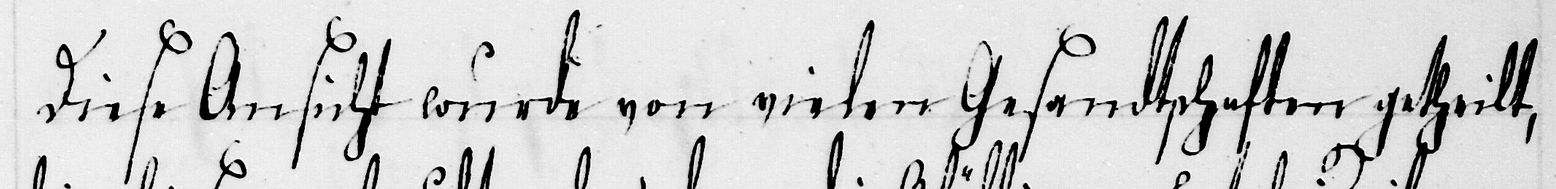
Diese Ansicht wurde von vielen Gesandtschaften gethei¬
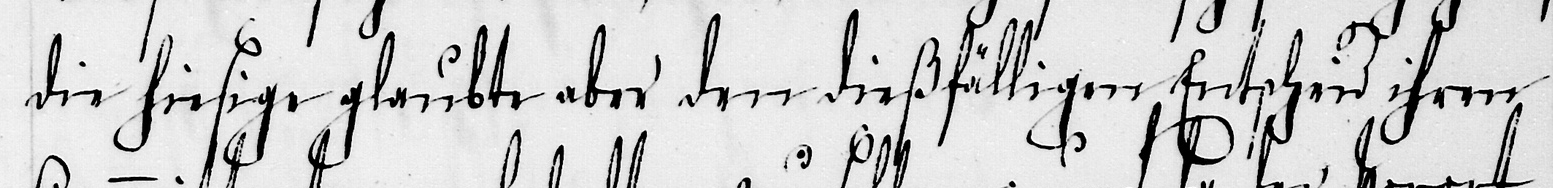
die hiesige glaubte aber den dießfälligen Entscheid ihren
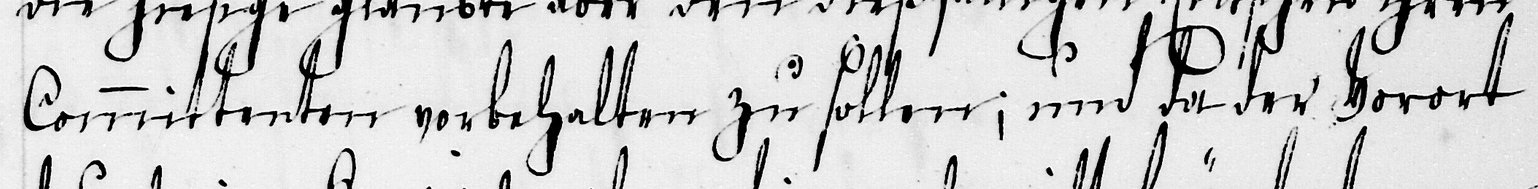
Committenten vorbehalten zu sollen, und da der Vorort
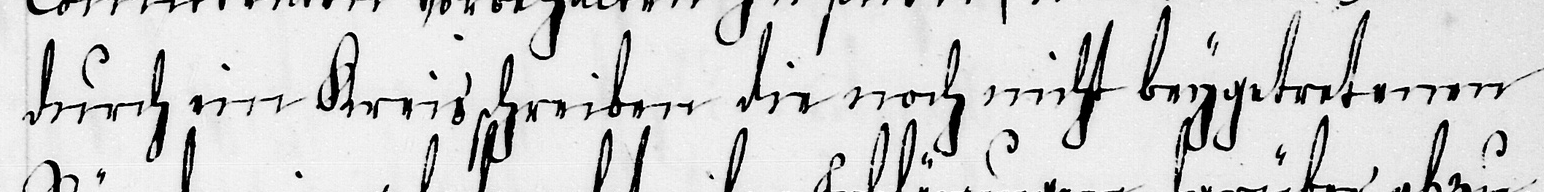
durch ein Kreisschreiben die noch nicht beygetretenen
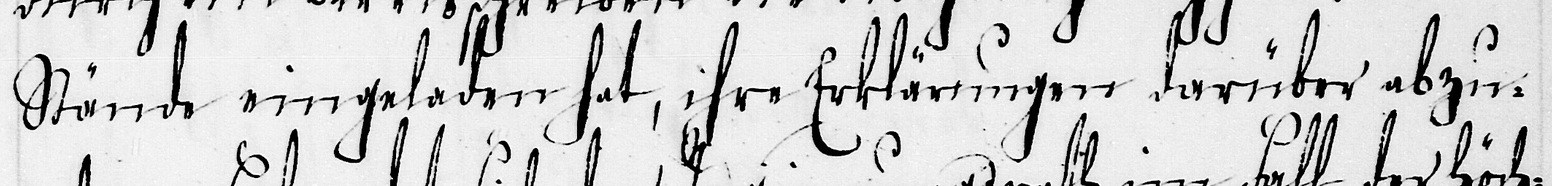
Stände eingeladen hat, ihre Erklärungen darüber abzu¬
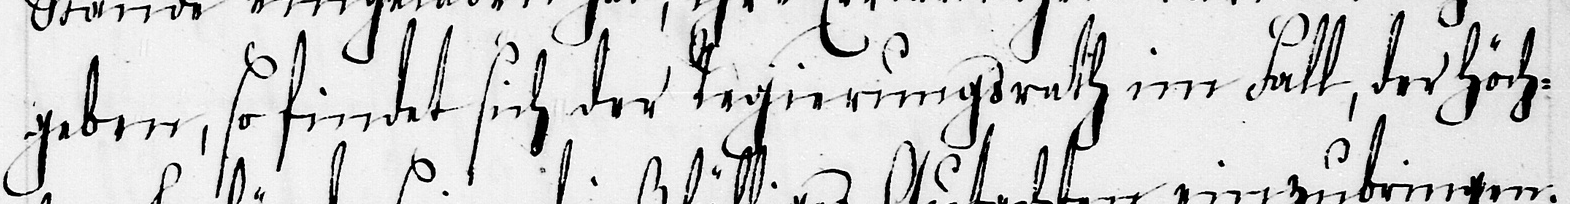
geben, so findet sich der Regierungsrath im Fall, der höch¬
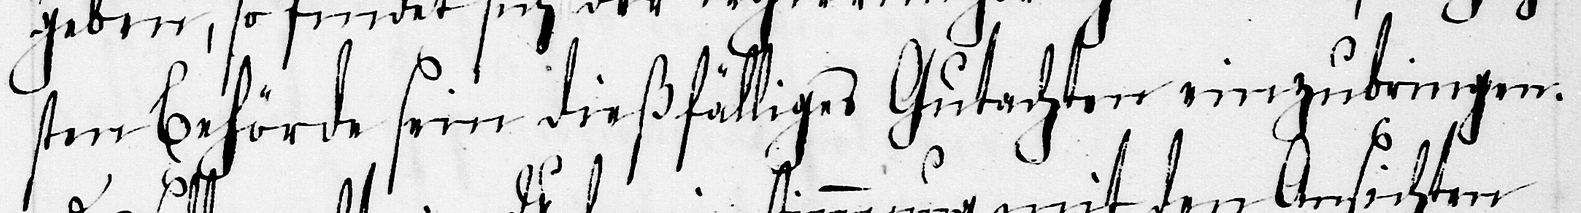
sten Behörde sein dießfälliges Gutachten einzubringen.
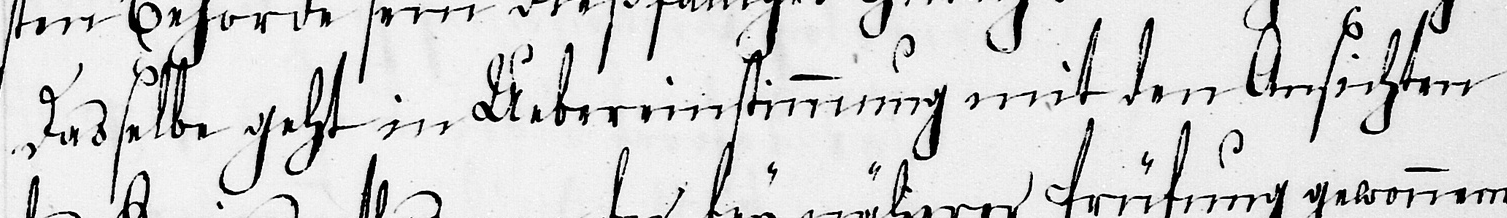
Dasselbe geht in Uebereinstimmung mit den Ansichten
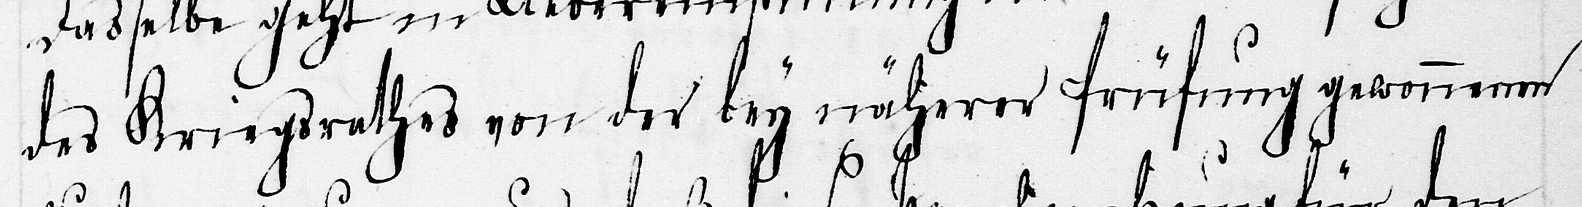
des Kriegsrathes von der bey näherer Prüfung gewonnenen
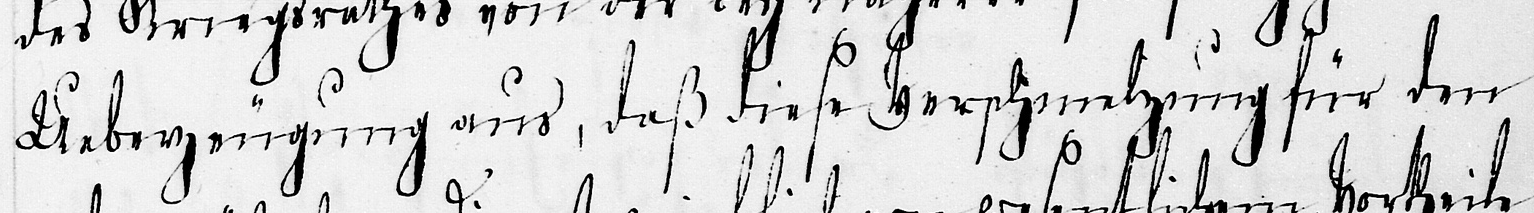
Ueberzeugung aus, daß diese Verschmelzung für den
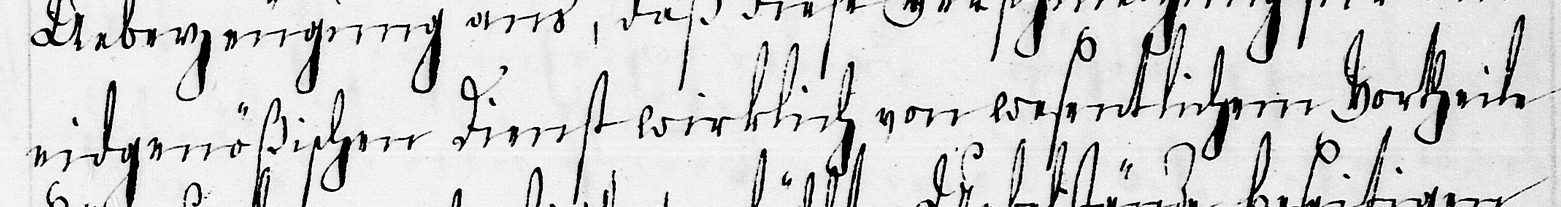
eidgenößischen Dienst wirklich von wesentlichem Vortheile
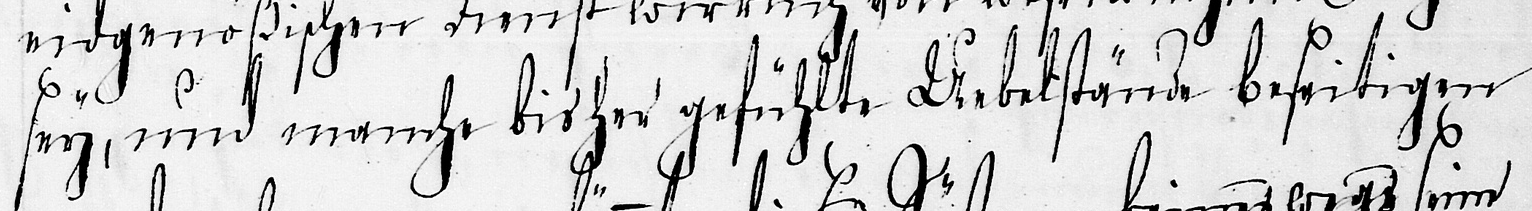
sey, und manche bisher gefühlte Uebelstände beseitigen
